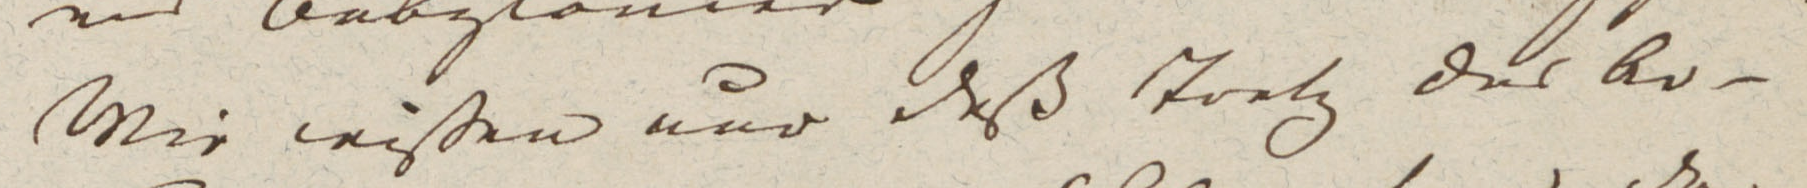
Wir wissen nur dass trotz der Ar-
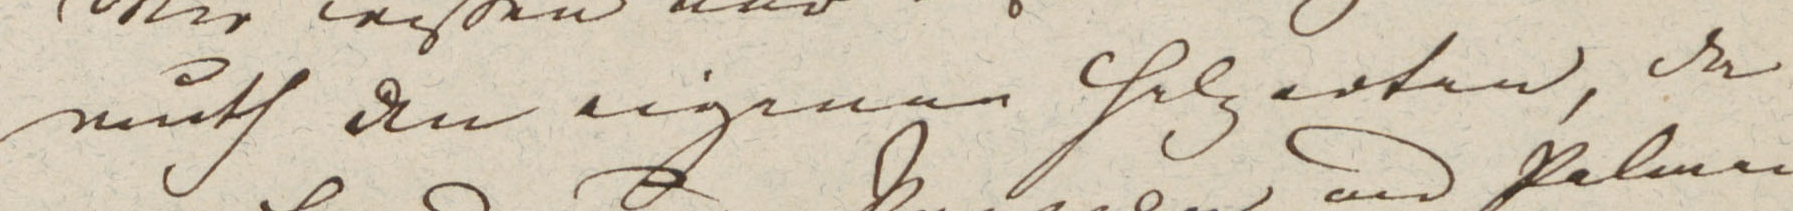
muth an eigenen Holzarten, da
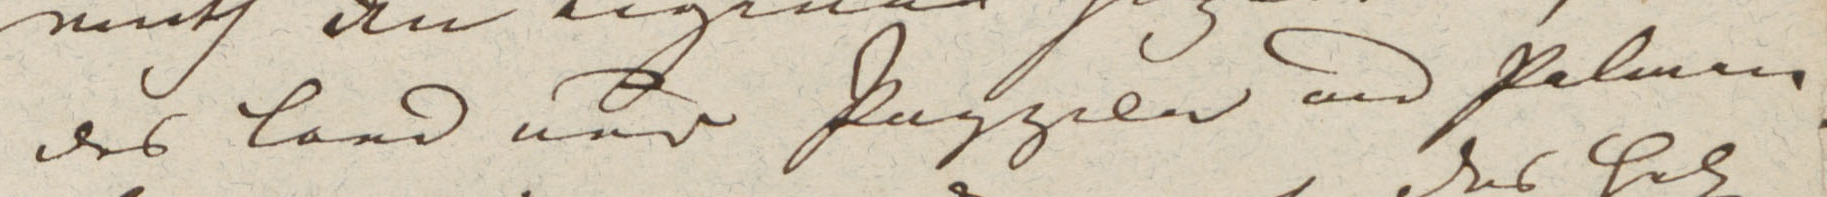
das Land nur Pappeln und Palmen
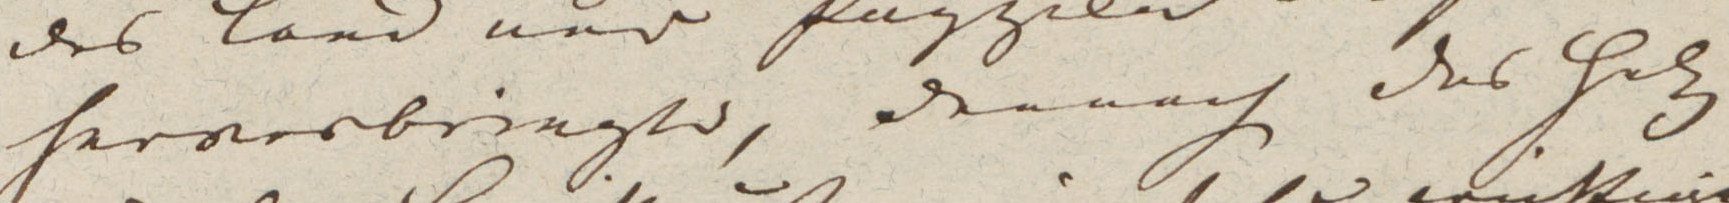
hervorbringt, dennoch das Holz
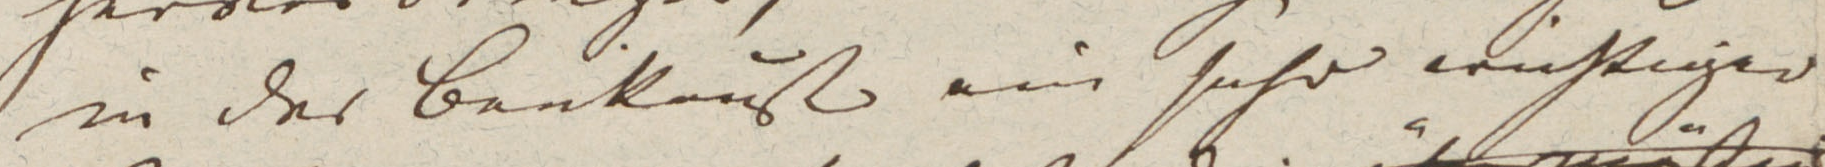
in der Baukunst ein sehr wichtiger
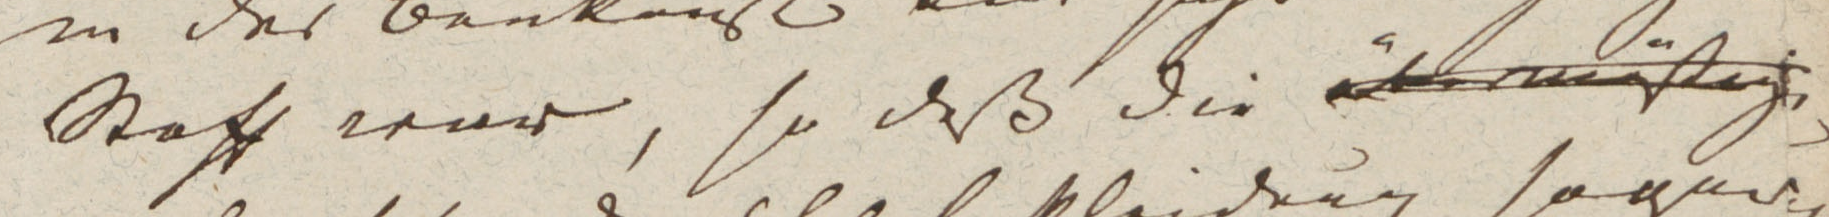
Stoff war, so dass die übermässig
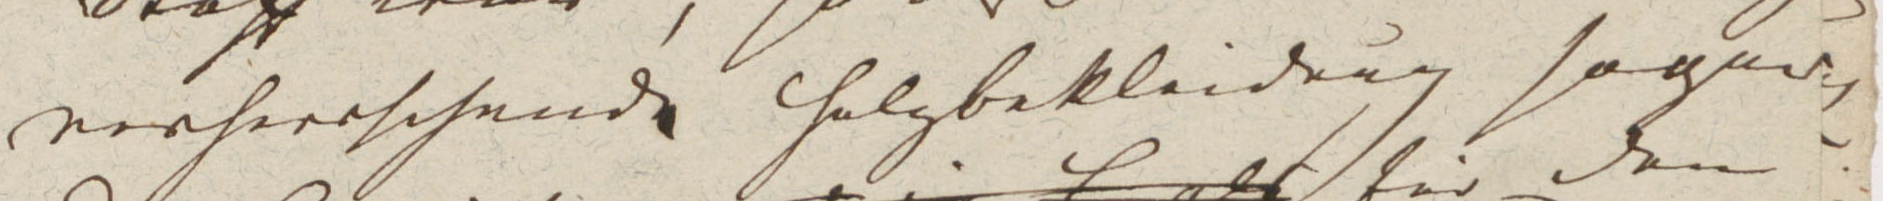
vorherrschende Holzbekleidung sogar
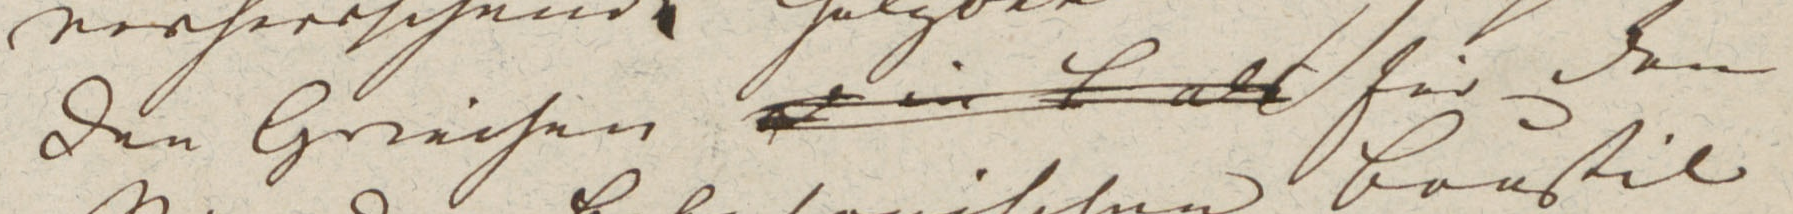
den Griechen d in B als für den
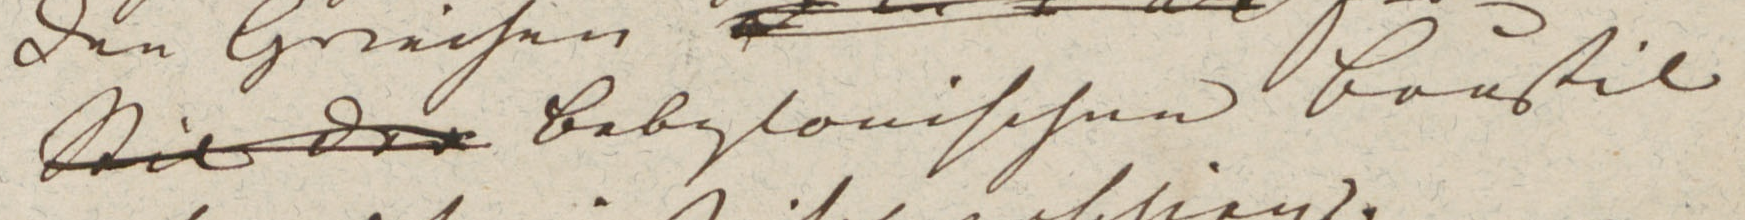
Stil der Babylonischen Baustil
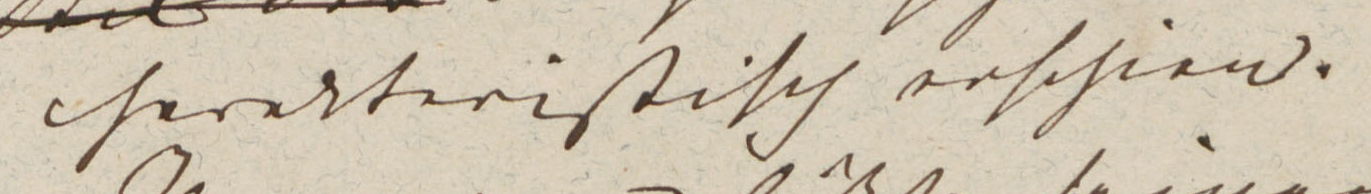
charakteristisch erschien.
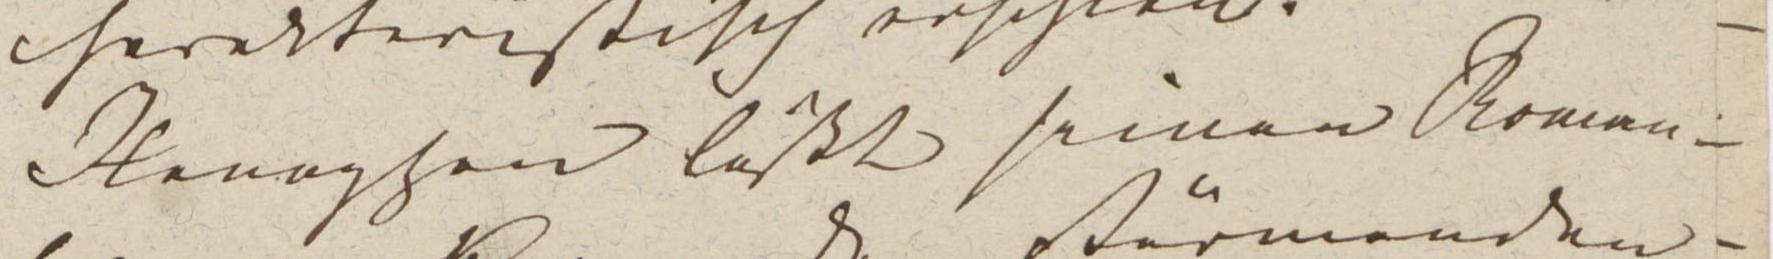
Xenophon lässt seinen Roman-
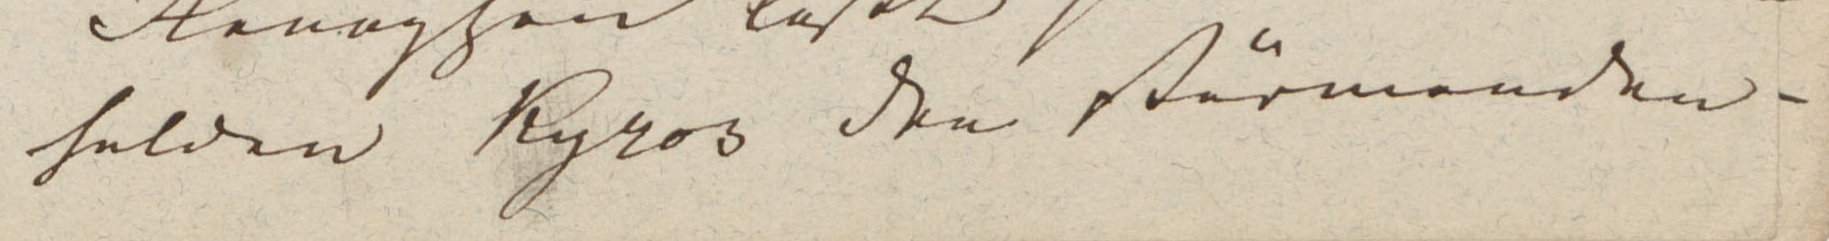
helden Kyros den stürmenden
